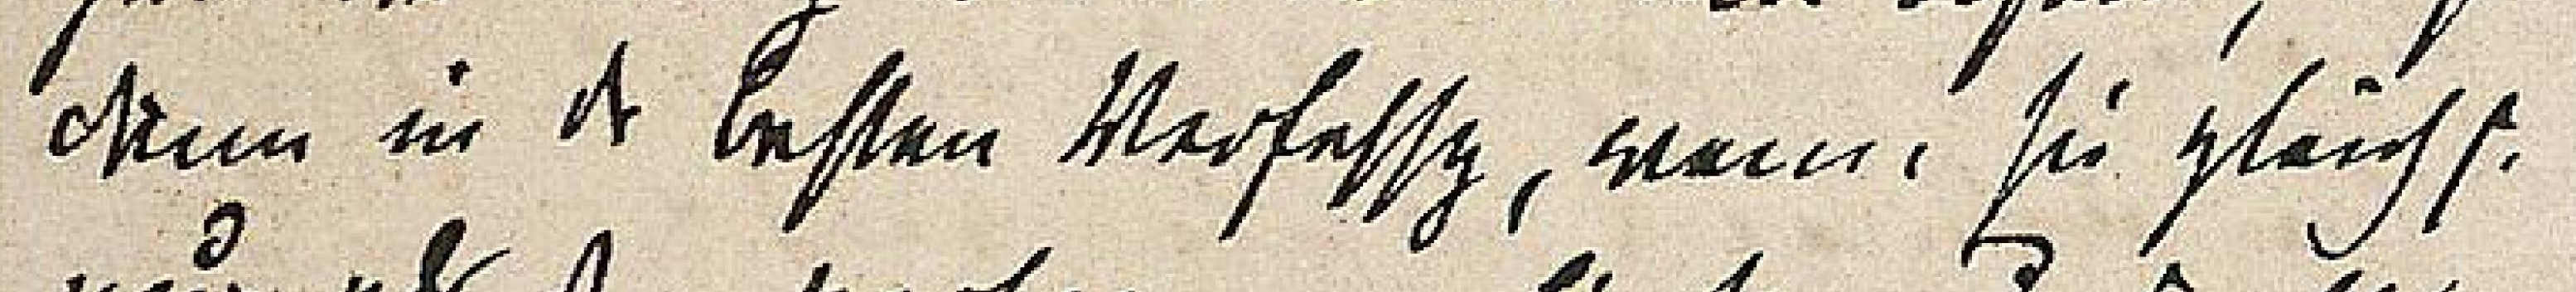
dann in d. besten Verfassg, wenn sie gleich s.
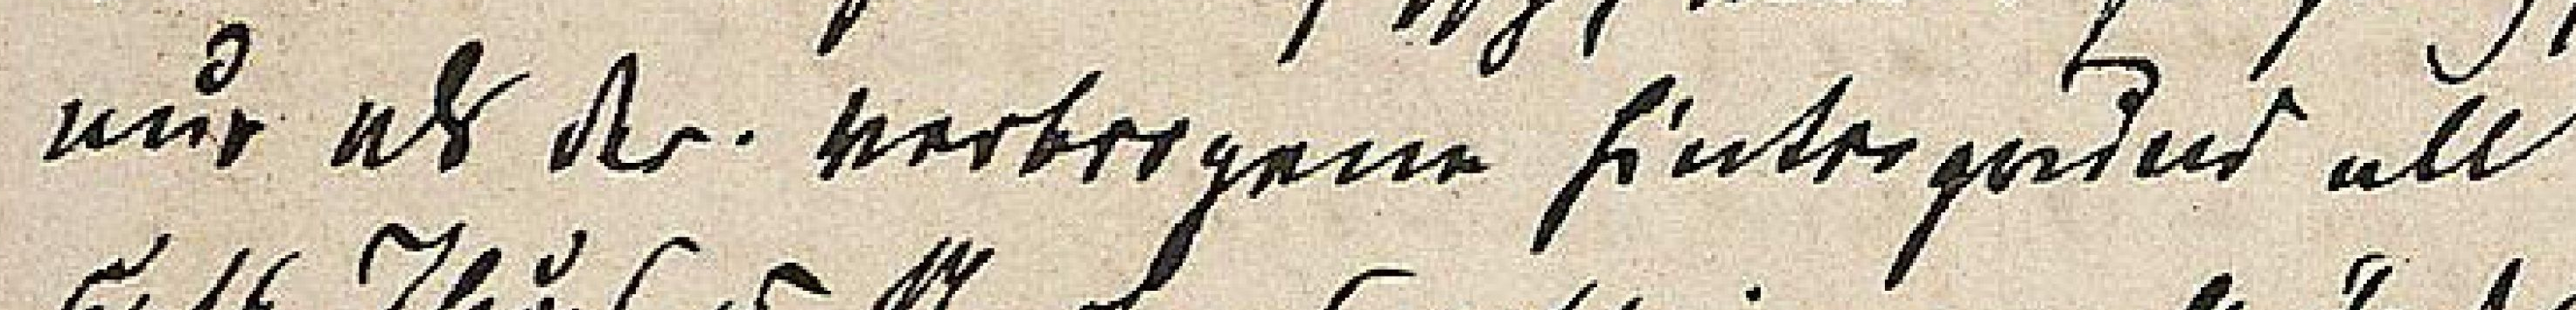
nur als der verborgene Hintergund all
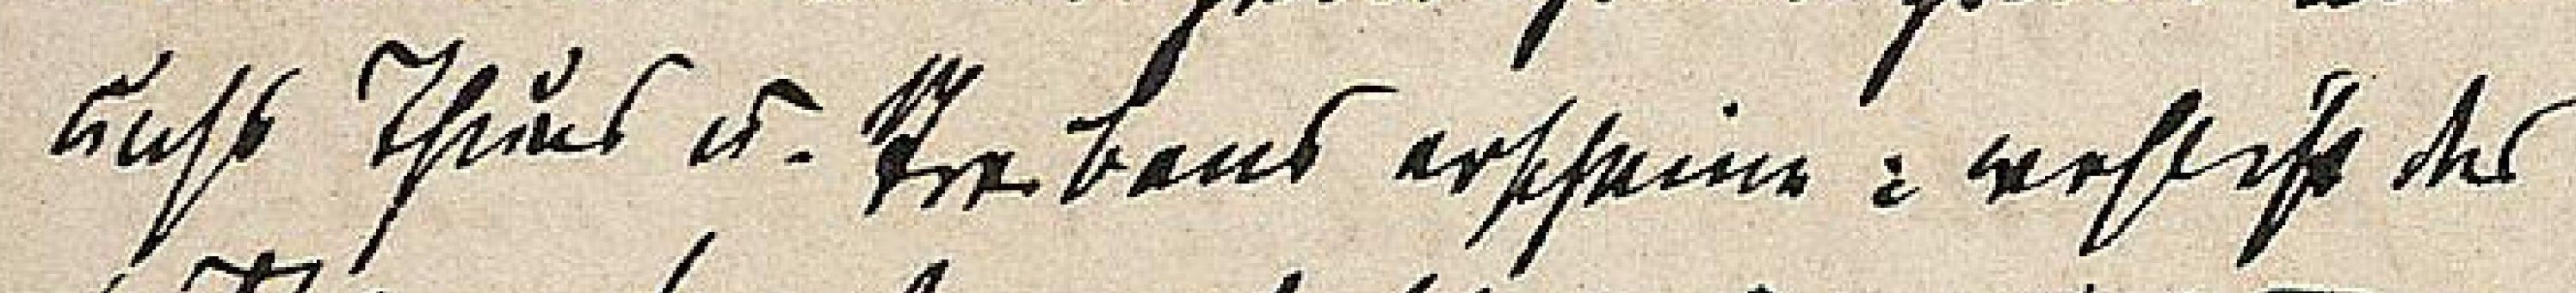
unss Thuns u. Treibens erscheine: wohl ist das
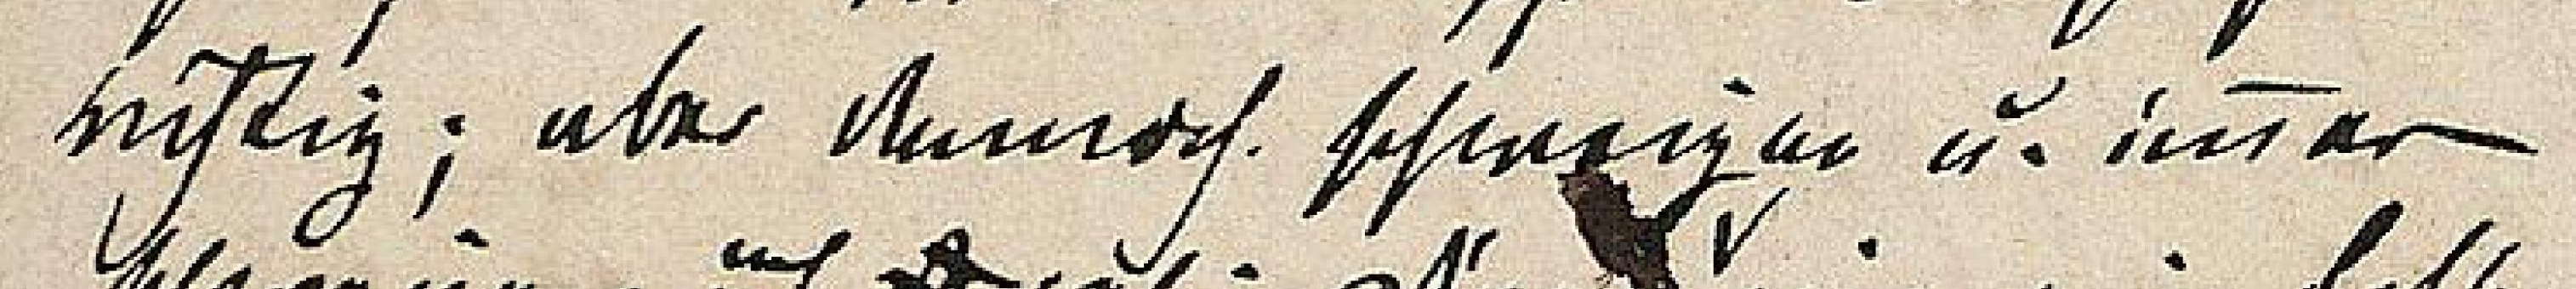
richtig; aber dennoch schweigen u. immer
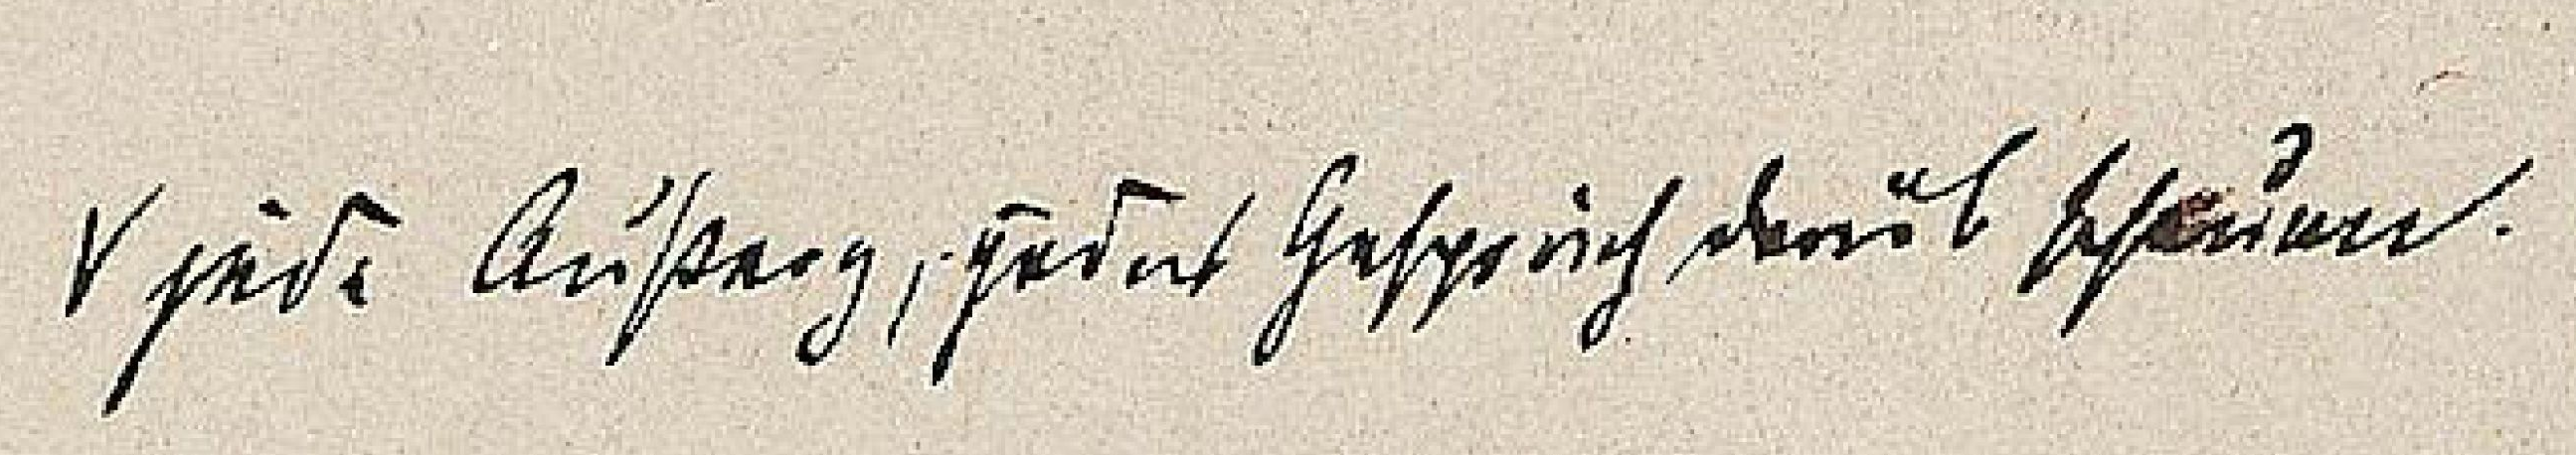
V jede Außerg, jedes Gespräch darüb scheuen.
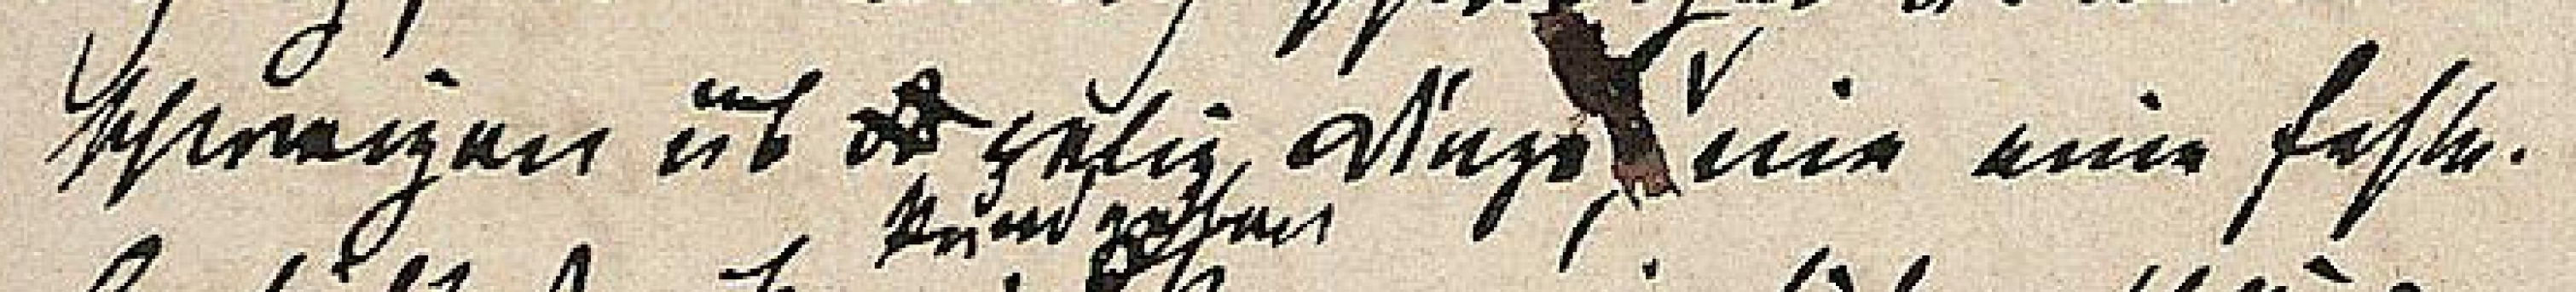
schweigen üb d. relig. Dinge nie eine feste.
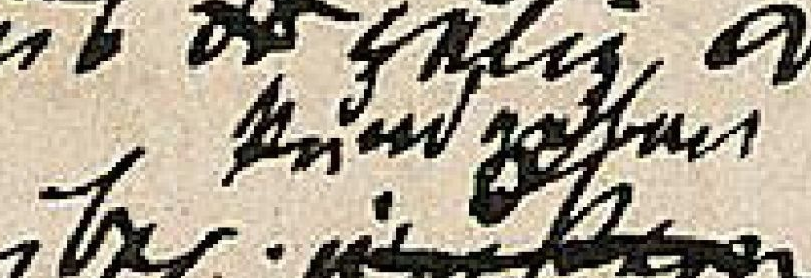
kund geben
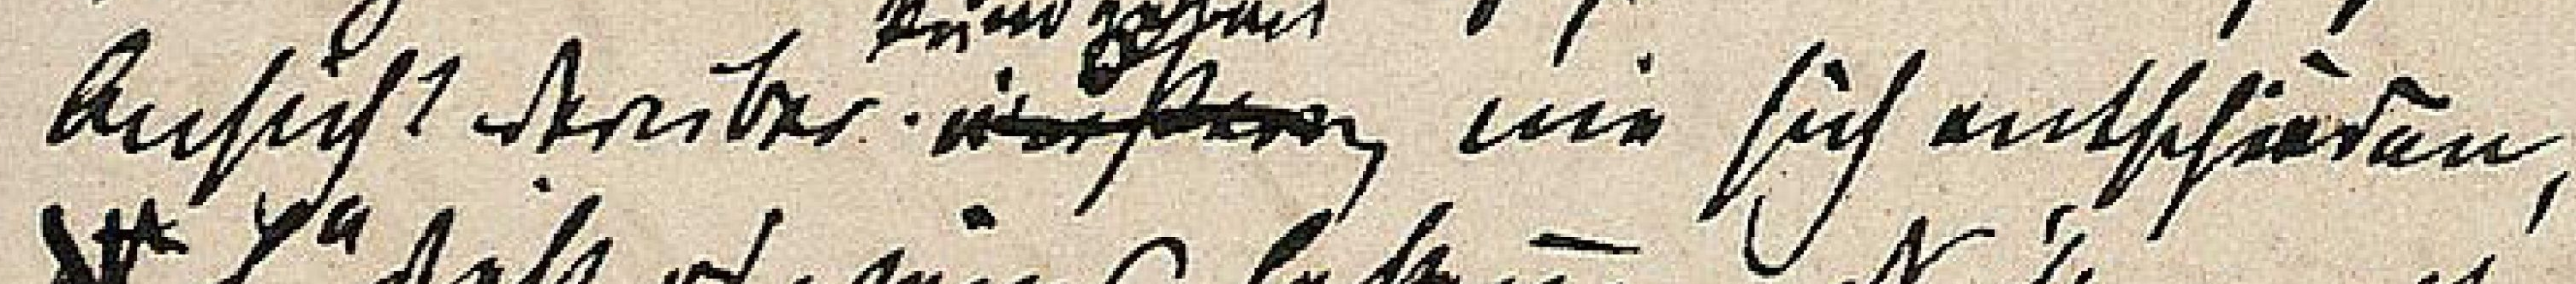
Ansicht darüber. äußern, wie sich entschieden,
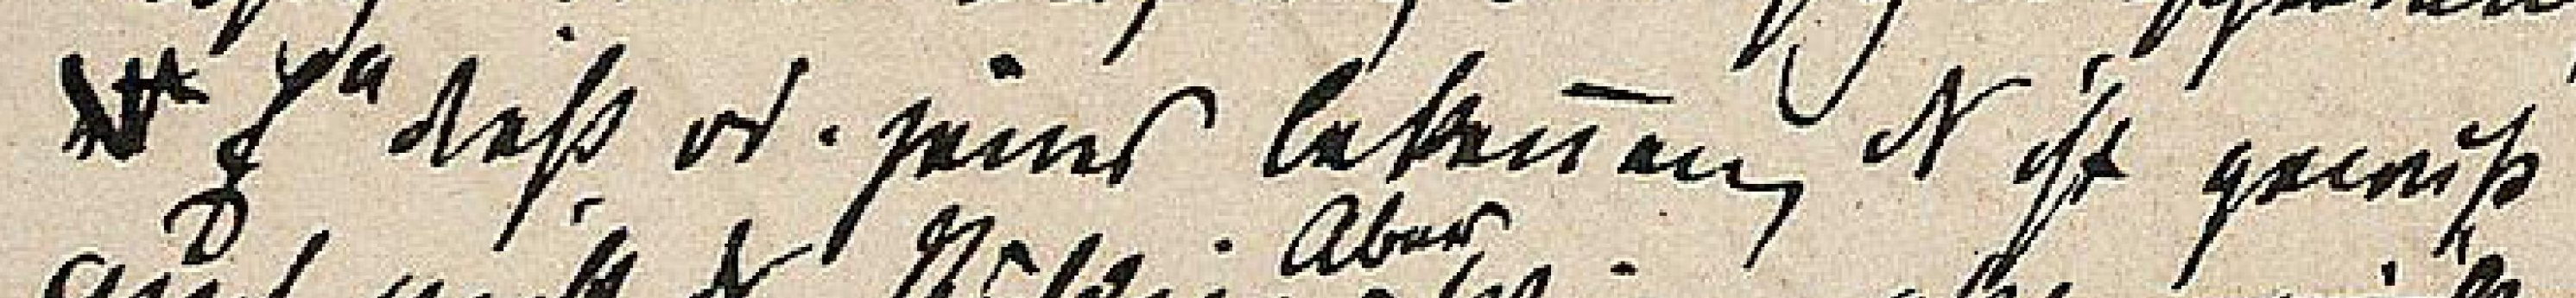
u. fÜ dies ob. jenes bekenen, das ist gewiß
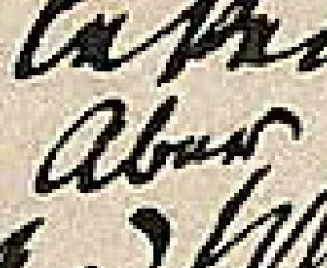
aber
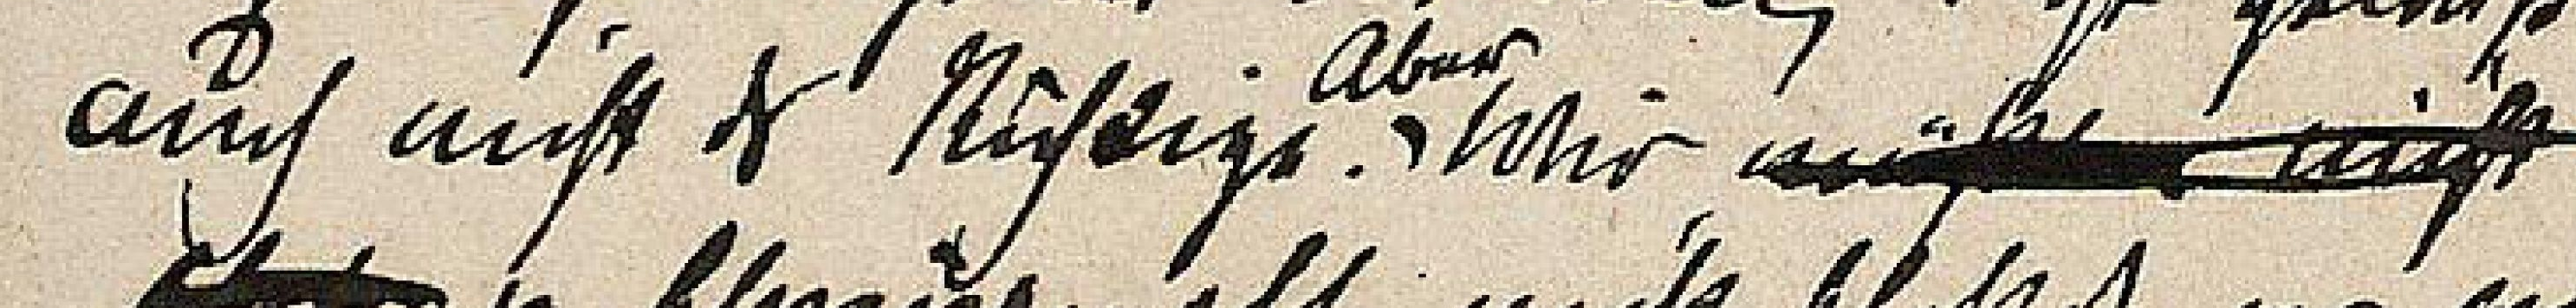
auch nicht des Richige. Wir müßten nicht
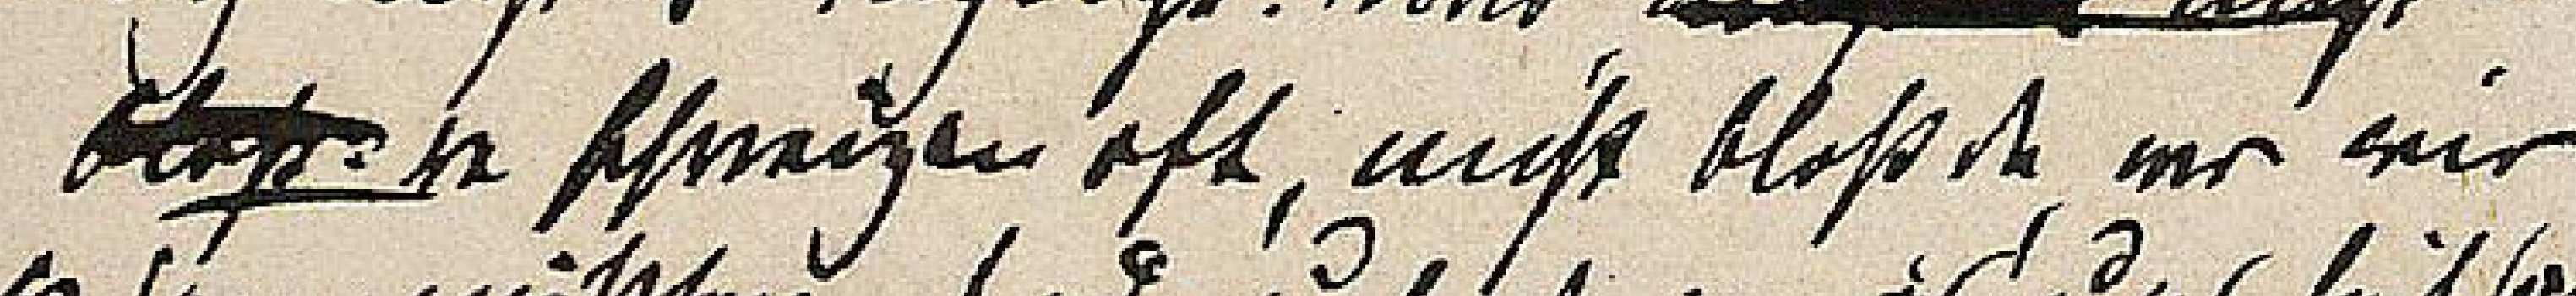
bloß v. schweigen oft, nicht bloß wo wir
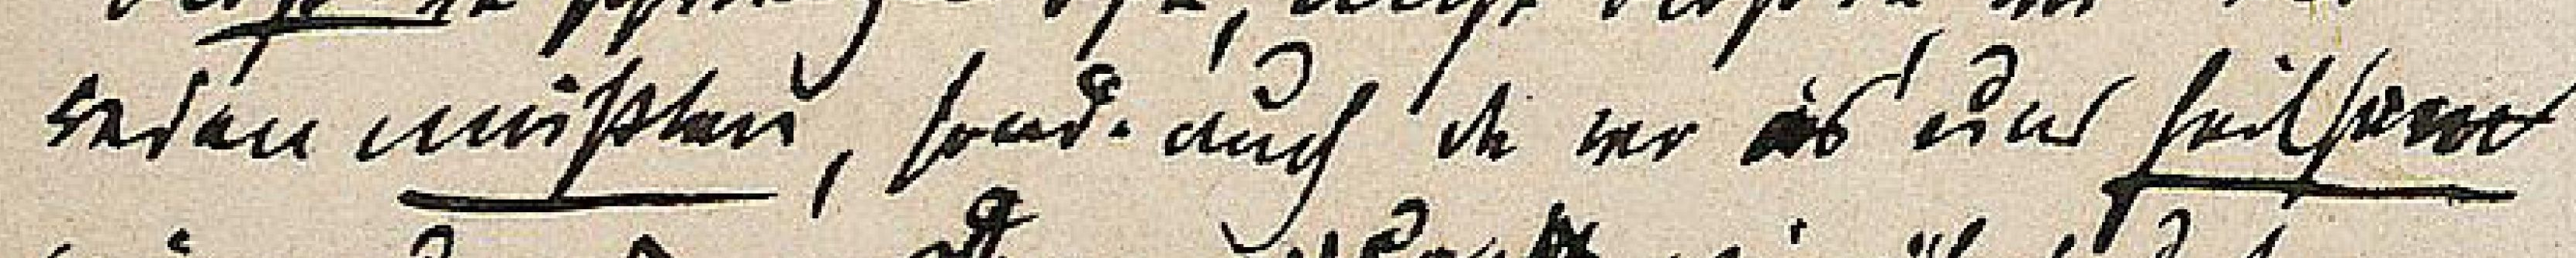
reden müßten, sond. auch da wo s' uns heilsam
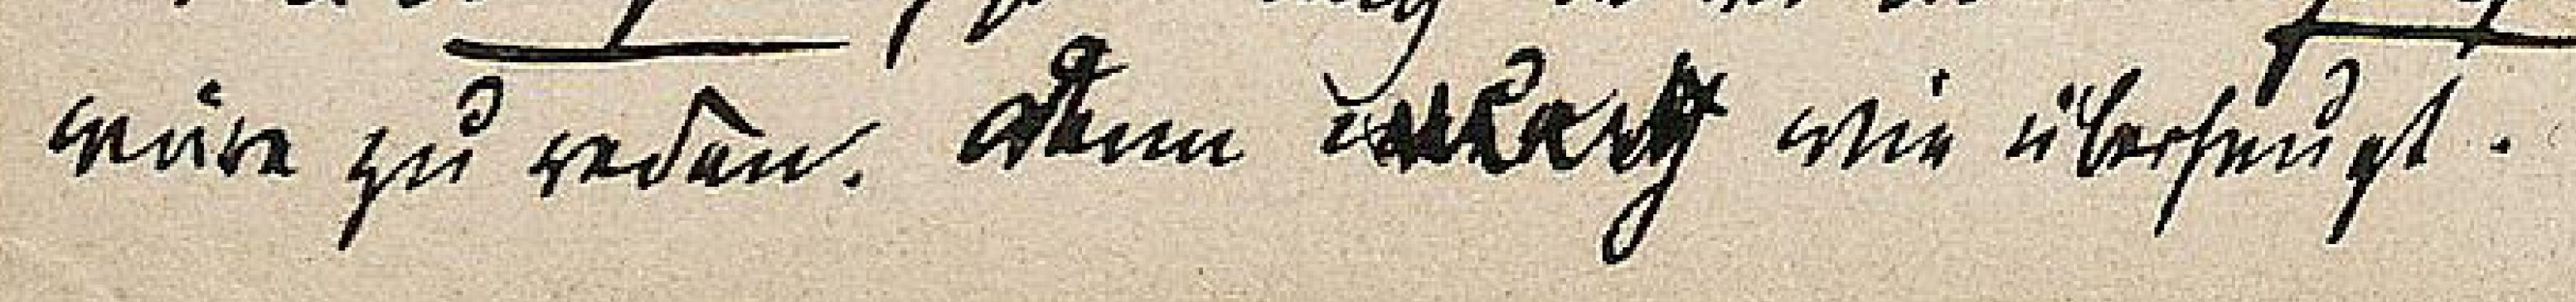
wäre zu reden. Denn muß wie überhaupt.
